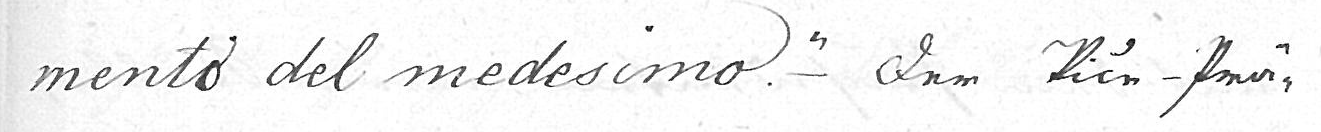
mento del medesimo." - Der Vice-Prä-
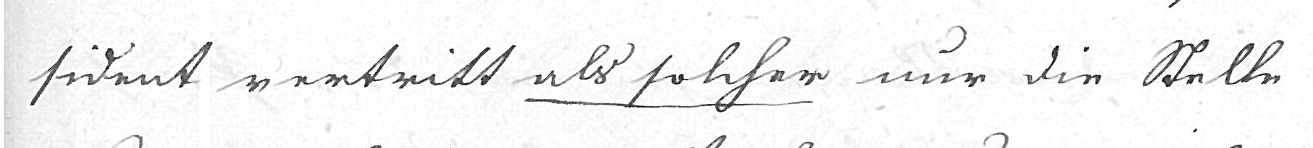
sident vertritt als solcher nur die Stelle
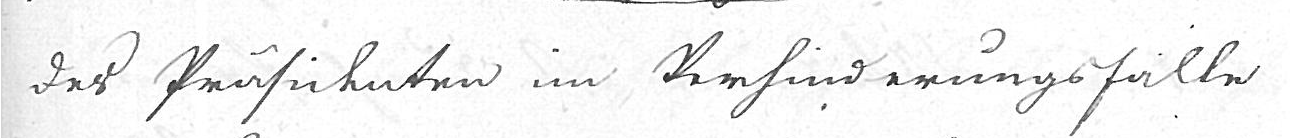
des Präsidenten im Verhinderungsfalle
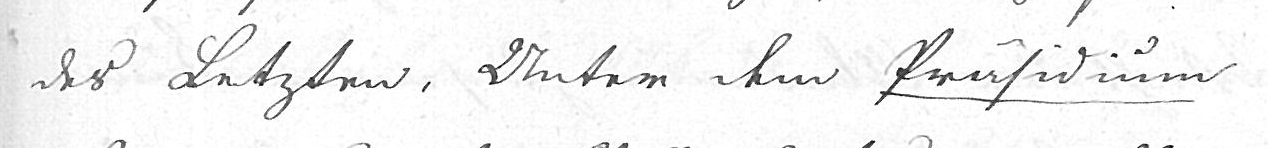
des Letzteren, Unter dem Präsidium
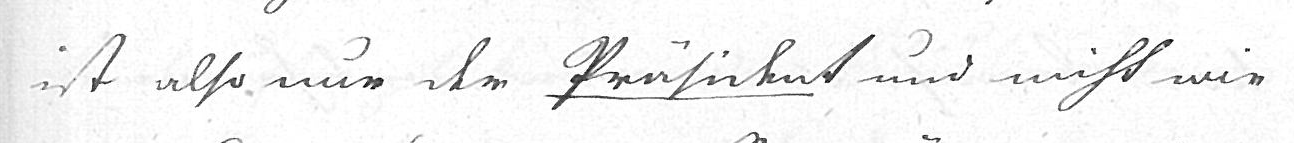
ist also nur der Präsident und nicht wie
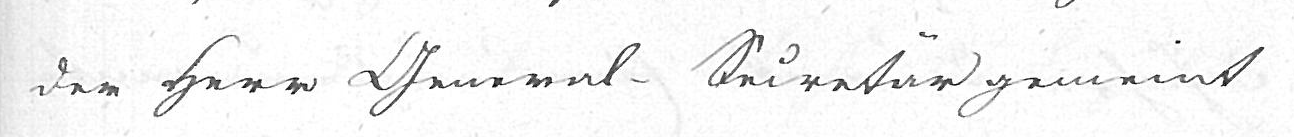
der Herr General-Secretär gemeint
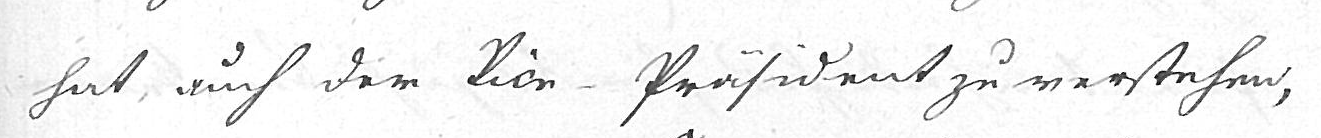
hat, auch der Vice-Präsident zu verstehen,
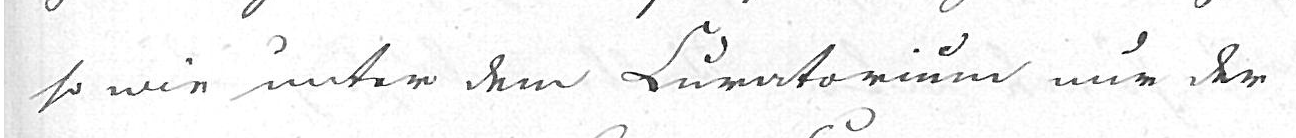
so wie unter dem Curatorium nur der
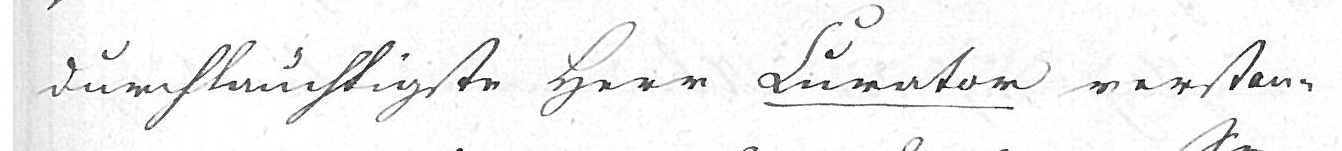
durchlauchtigste Herr Curator verstan-
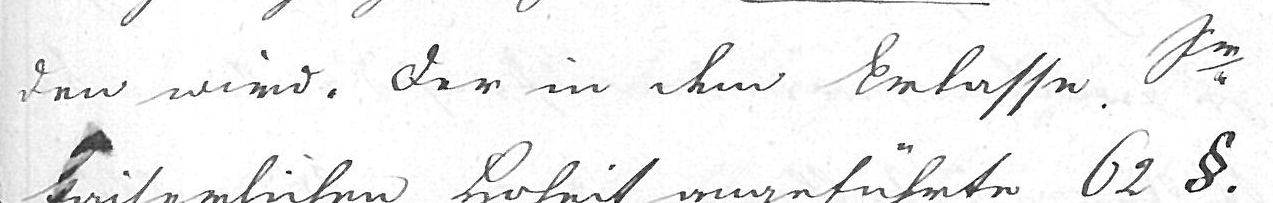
den wird. Der in dem Erlasse Sr.
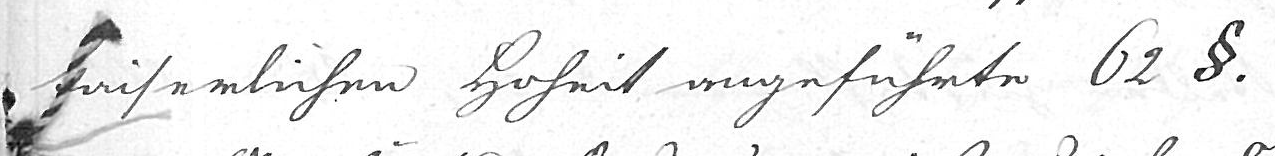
kaiserlichen Hoheit angeführte 62 §.
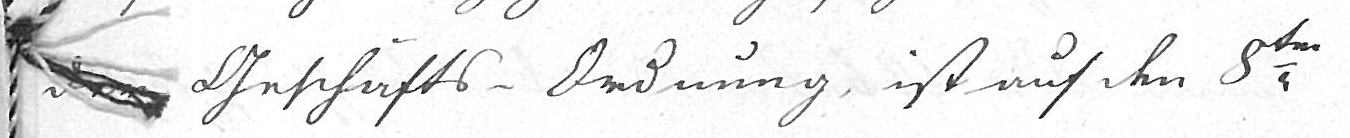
der Geschäfts-Ordnung, ist auf den 8ten
